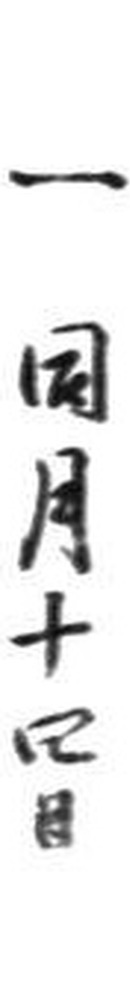一同月十四日
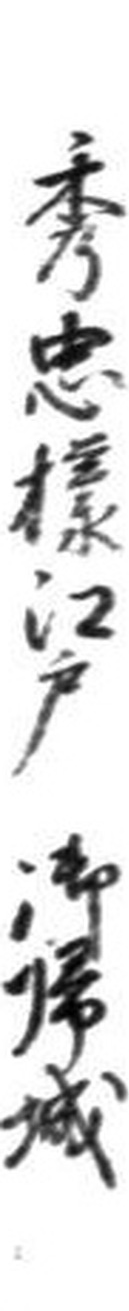秀忠様江戸御帰城

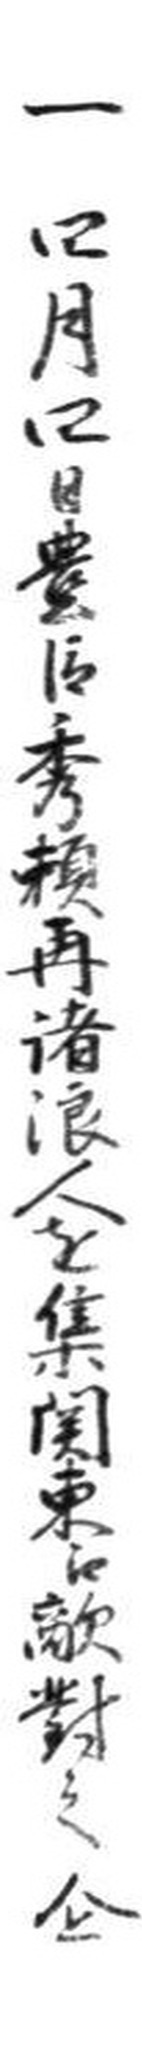一四月四日豊臣秀頼再諸浪人を集関東江敵対之企
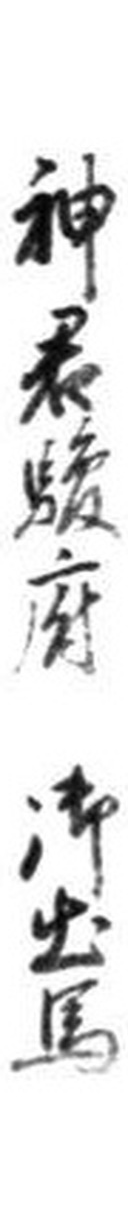神君駿府御出馬
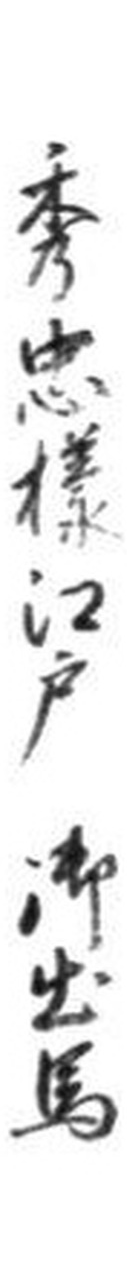秀忠様江戸御出馬
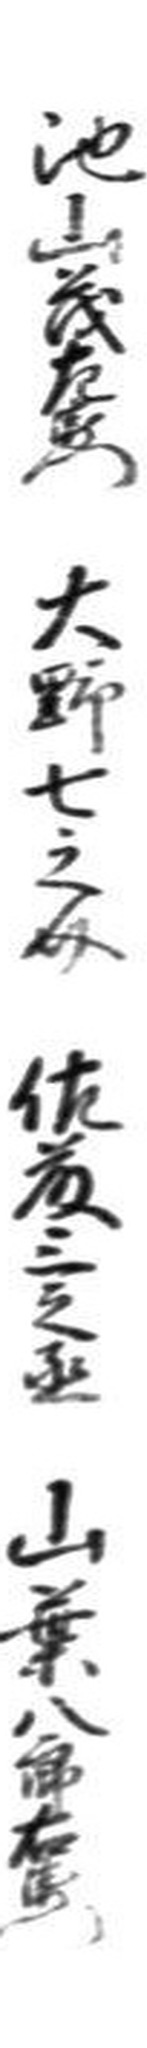池山茂左衛門大野七之介佐藤三之丞山葉八郎右衛門
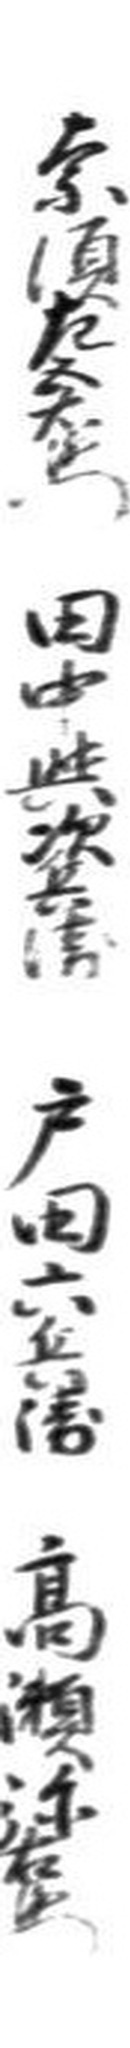奈須左五右衛門田中與次兵衛戸田六兵衛高瀬弥右衛門
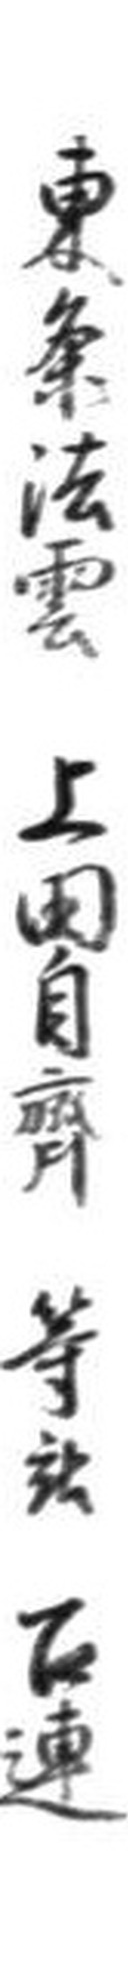東条法雲上田自齋等被召連
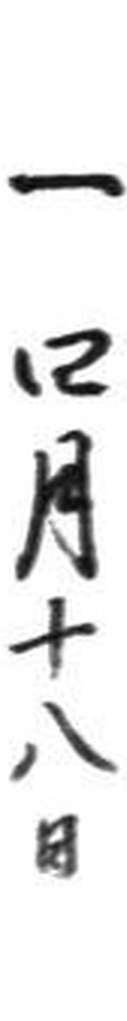一四月十八日

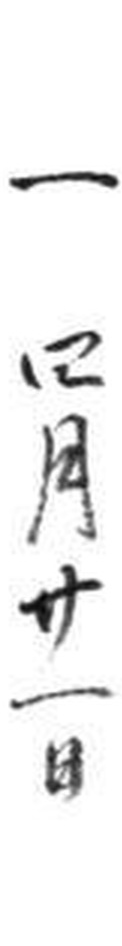一四月廿一日
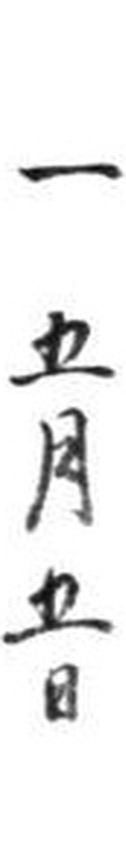一五月五日
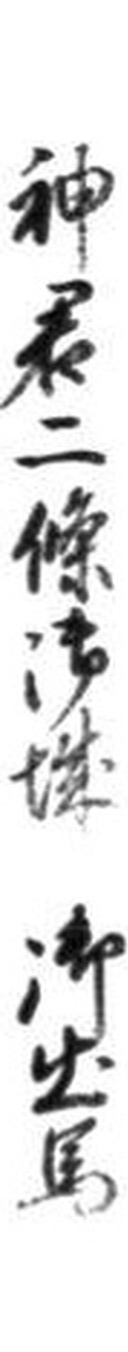神君二条御城御出馬
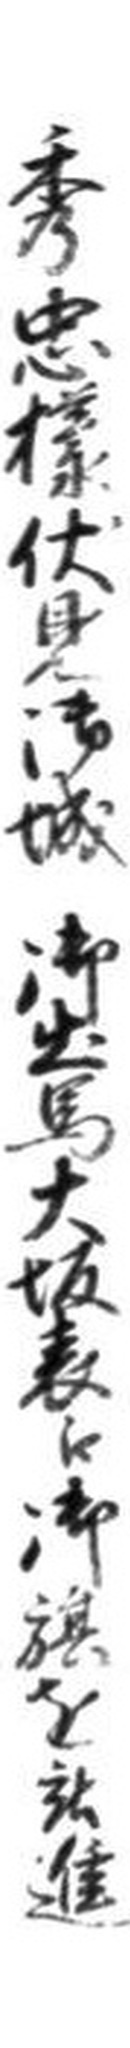秀忠様伏見御城御出馬大坂表江御旗を被進
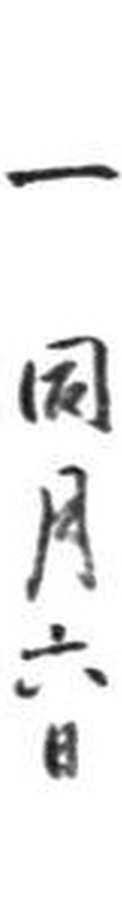一同月六日
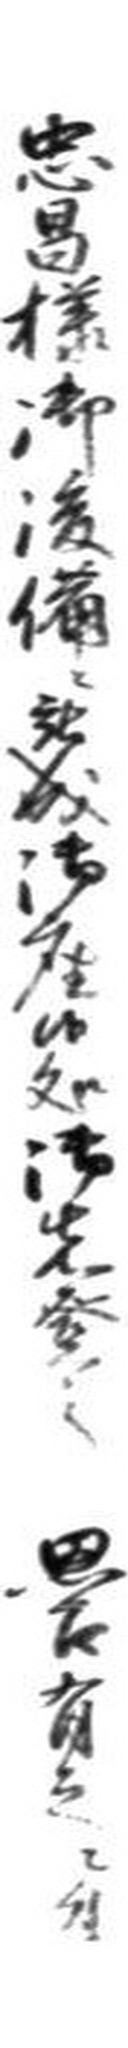忠昌様御後備ニ被成御座候処御先発之思召有之ニ付
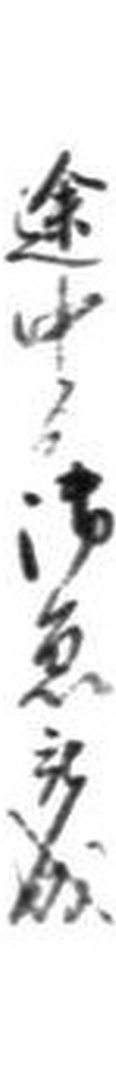途中ゟ御急被成
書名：家譜 三 忠昌公 従慶長八年到寛永六年
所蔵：福井県文書館 Fukui Prefectural Archives
